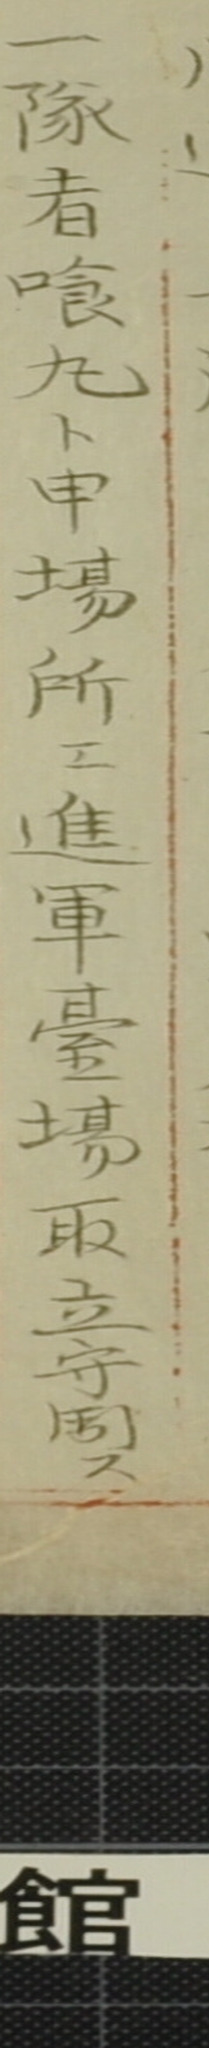一隊者喰丸ト申場所エ進軍台場取立守衛ス
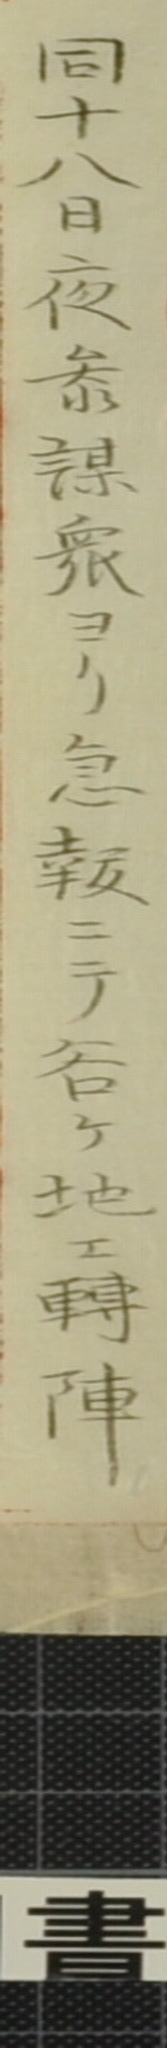同十八日夜参謀衆ヨリ急報ニテ谷ヶ地転陣

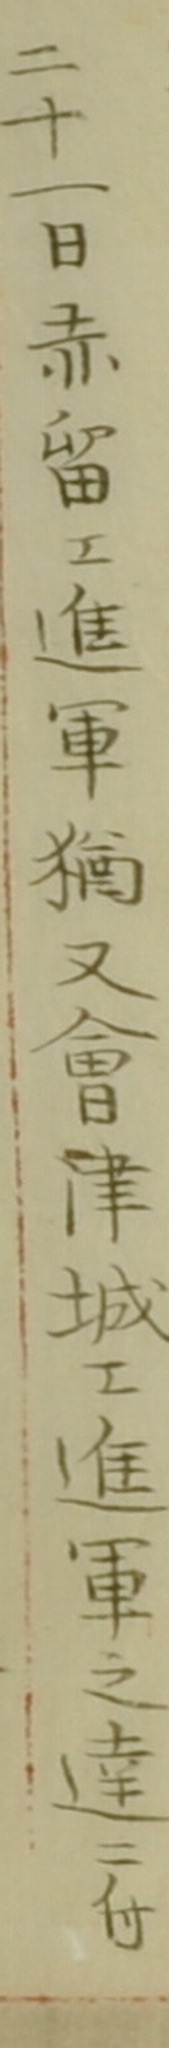二十一赤留エ進軍猶又会津城エ進軍之達ニ付
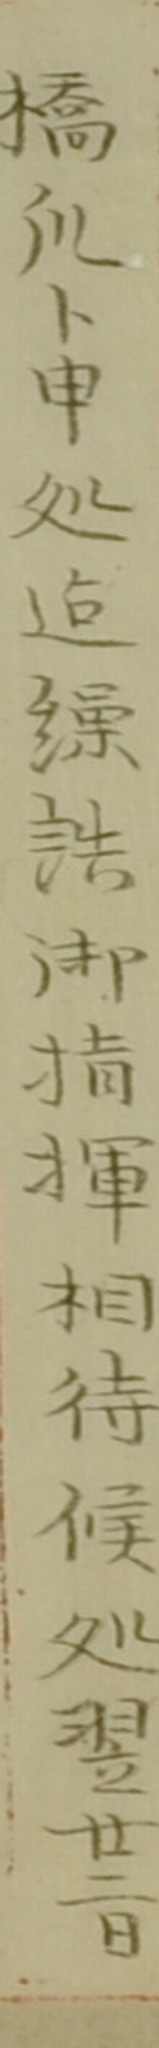橋爪ト申処迄繰詰御指揮相待候処翌廿二日
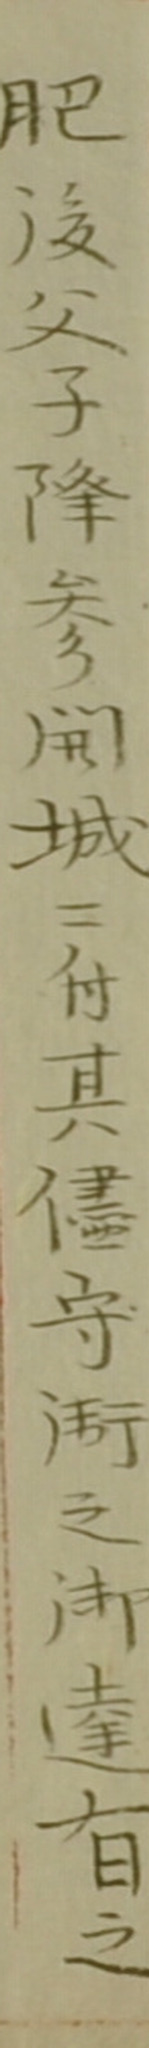肥後父子降参開城ニ付其侭守衛之御達有之
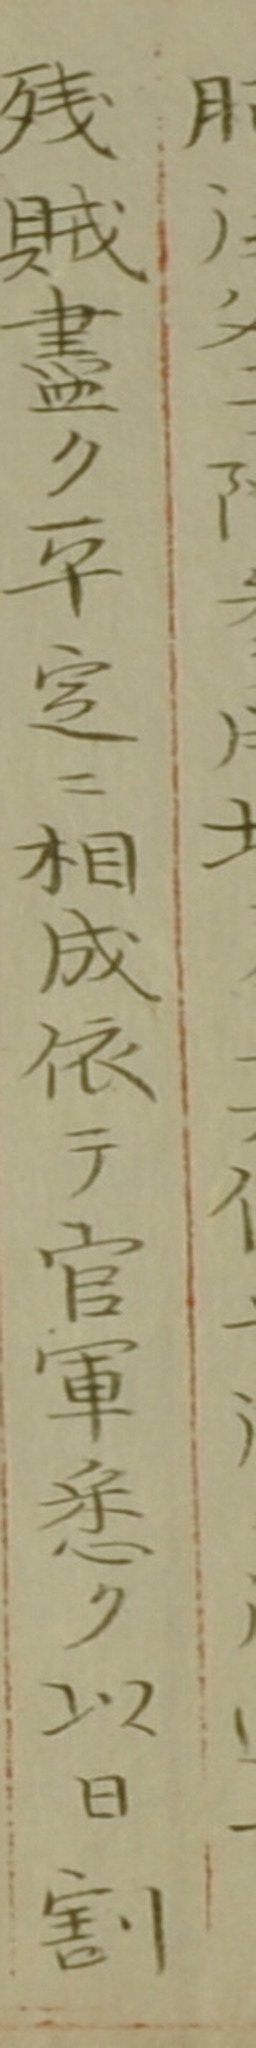残賊悉ク平定ニ相成依テ官軍悉ク以日割
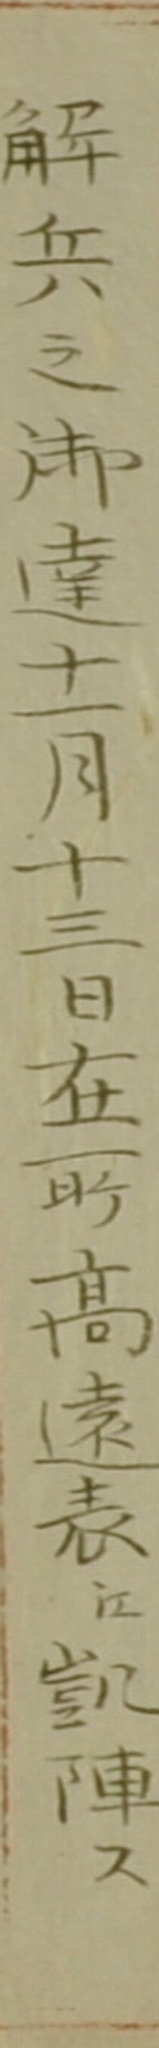解兵之御達十一月十三日在所高遠表江凱陣ス
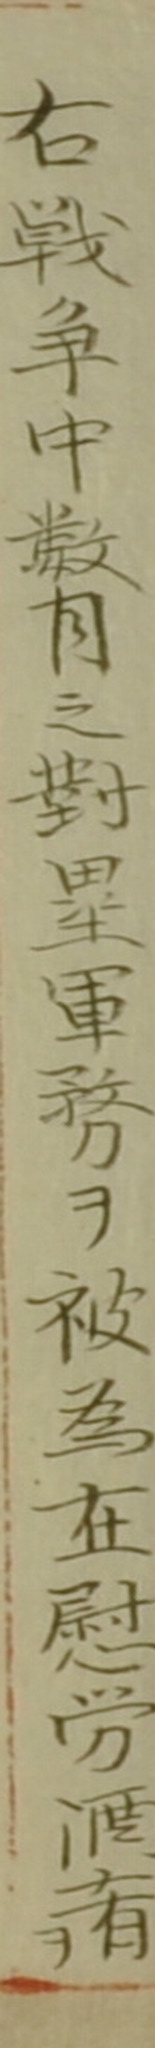右戦争中数月之対塁軍務ヲ被為在慰労酒肴ヲ
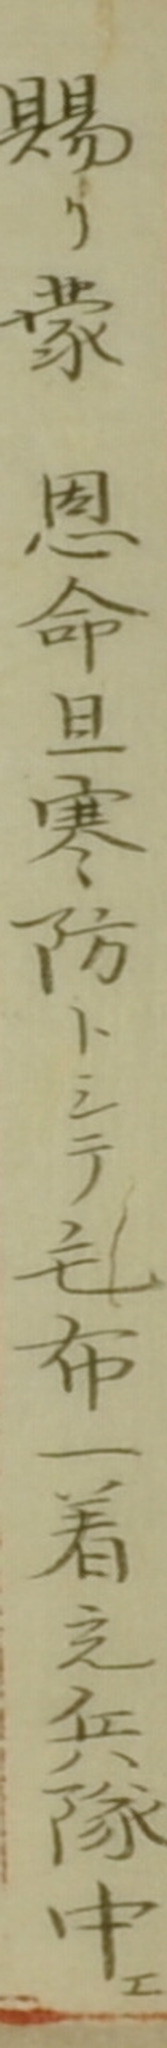賜リ蒙恩命旦寒防トシテ毛布一着充兵隊中エ
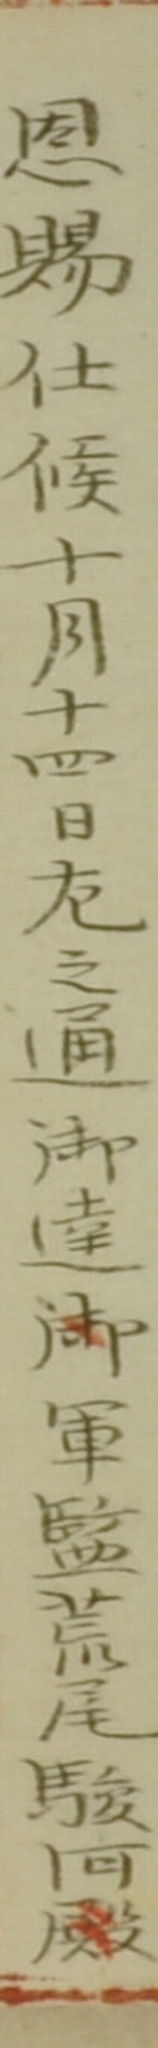恩賜仕候十月十四日左之通御達御軍監荒尾駿河殿
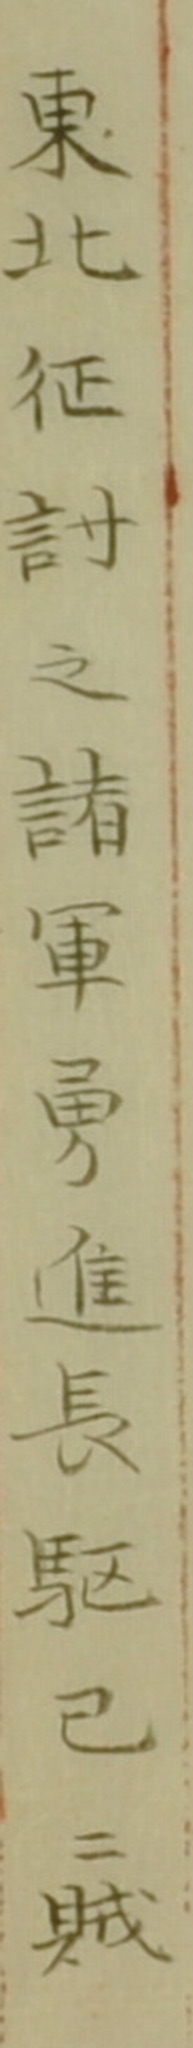東北征討之所諸軍勇進長駆已ニ賊
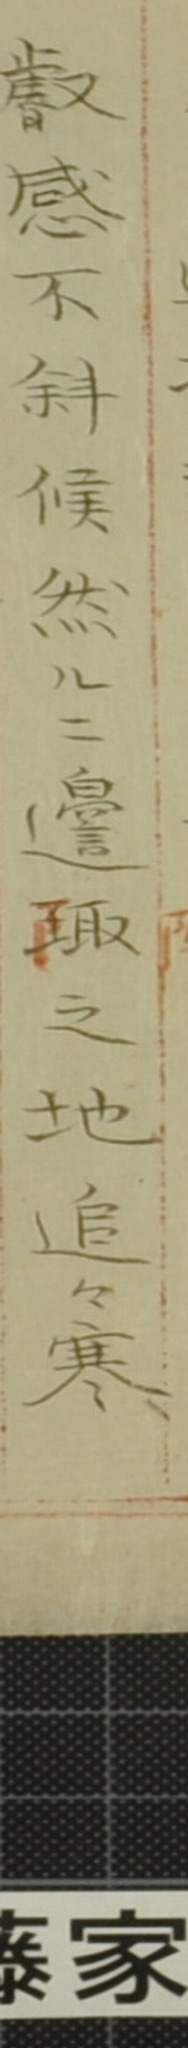叡感不斜候然ルニ辺陬之地追々寒
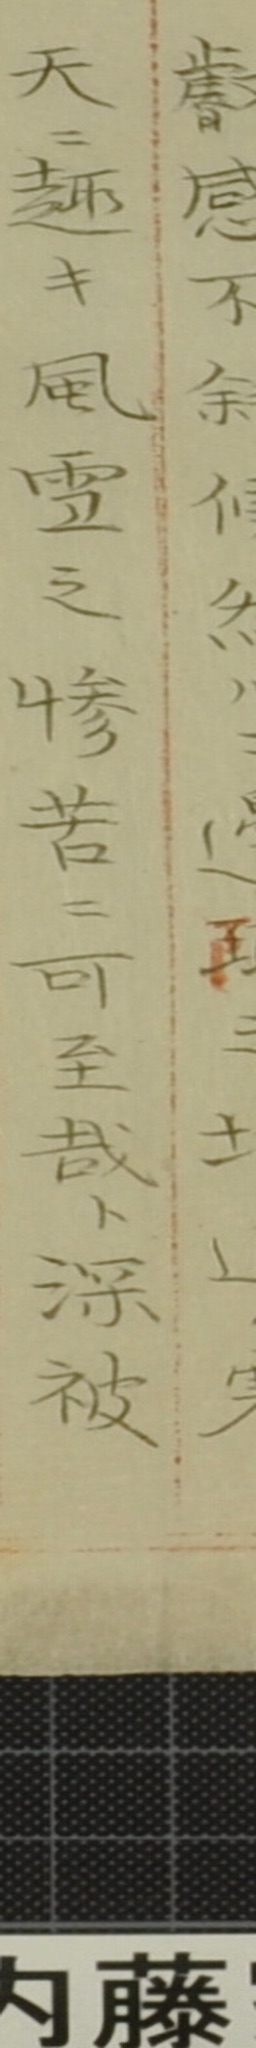天ニ趣キ風雪之惨苦ニ可至哉ト深被
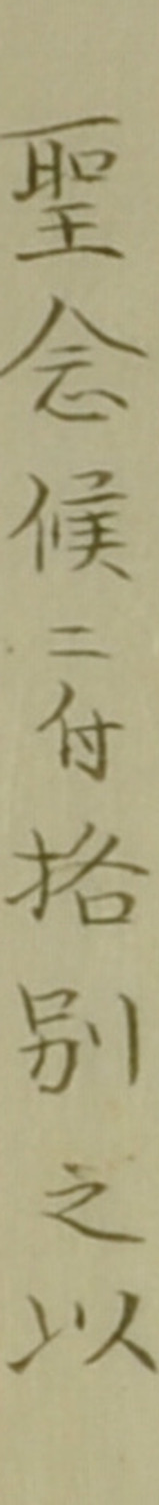聖念候ニ付格別之以
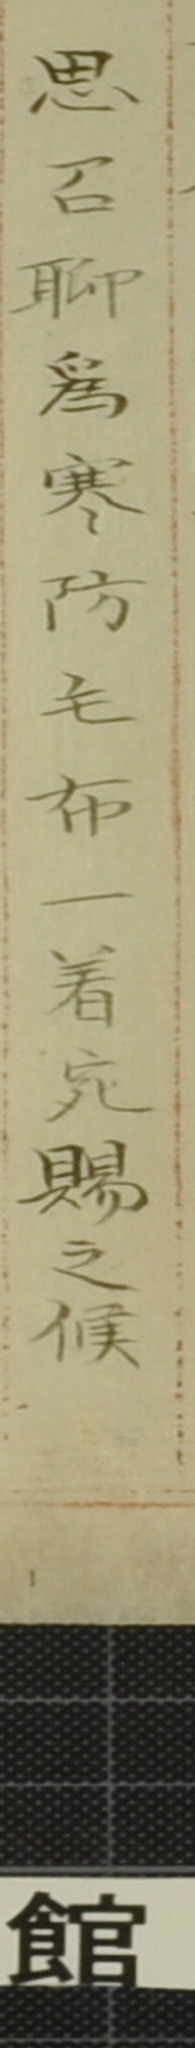思召聊為寒防毛布一着宛賜之候

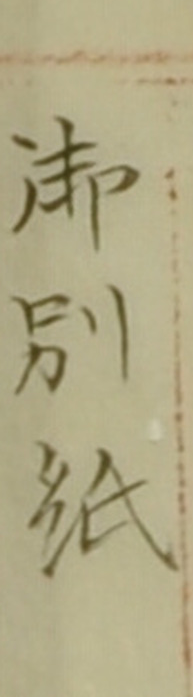御別紙
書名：奥越出兵中戦争之事件概略抄録（控）
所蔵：伊那市立高遠町図書館・合同会社AMANE
